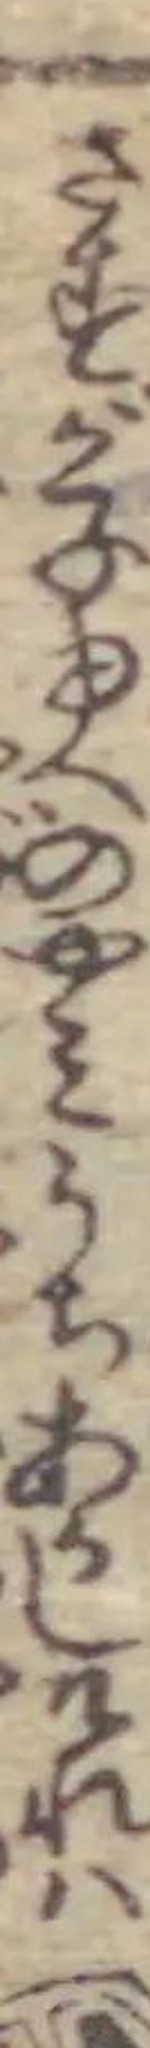さすが子ゆへのやみうちあかしけれは
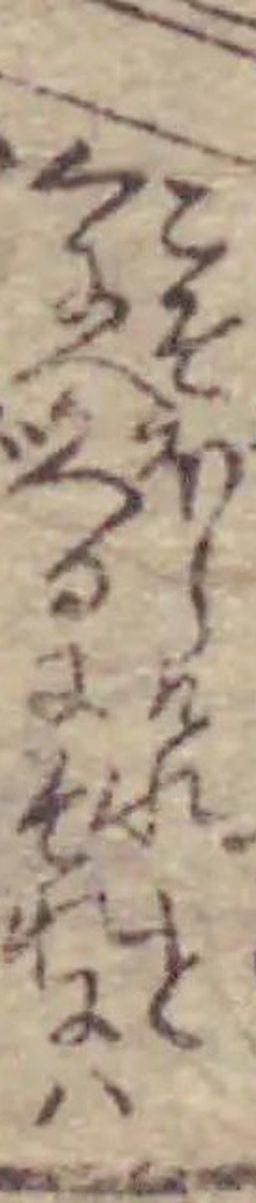くにへかへるにそれには
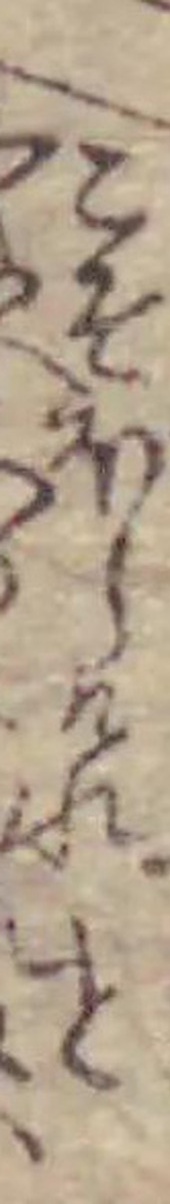こそほしけれと
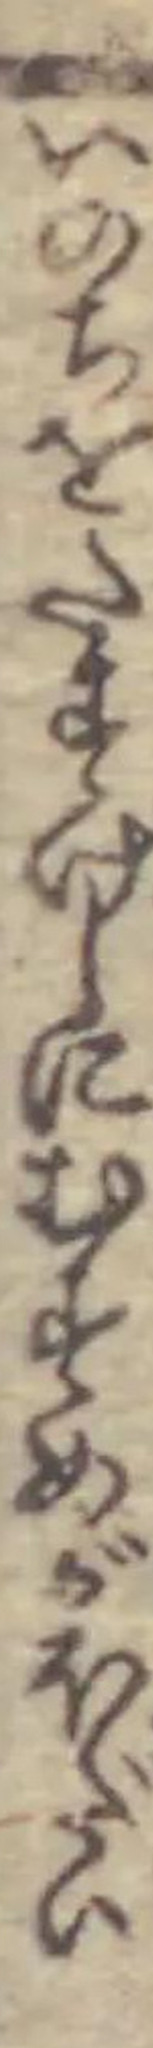いのちをたすけしにむすめがほだい
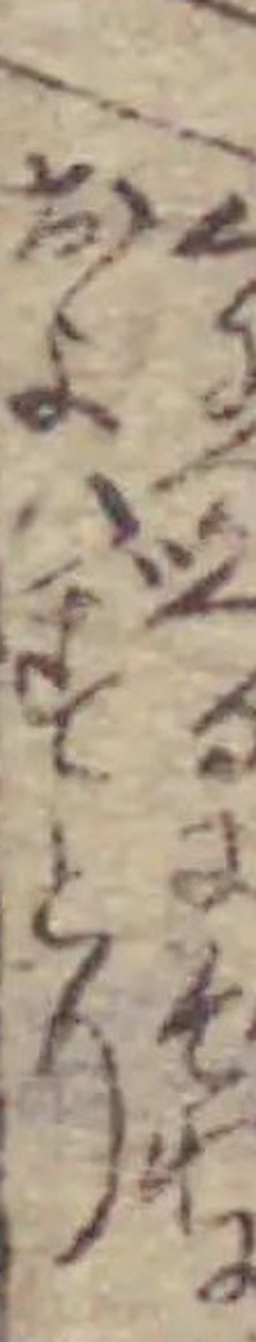およばずとり
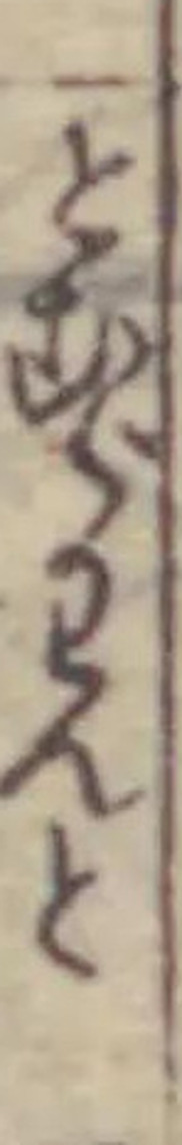とむらわんと
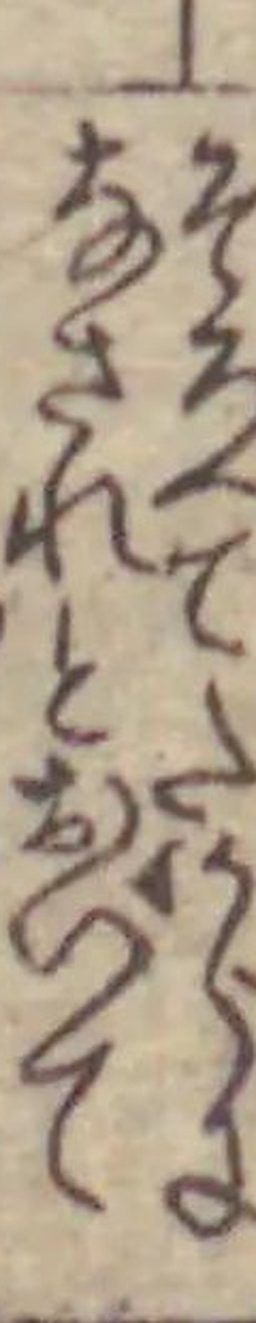なされとおいて
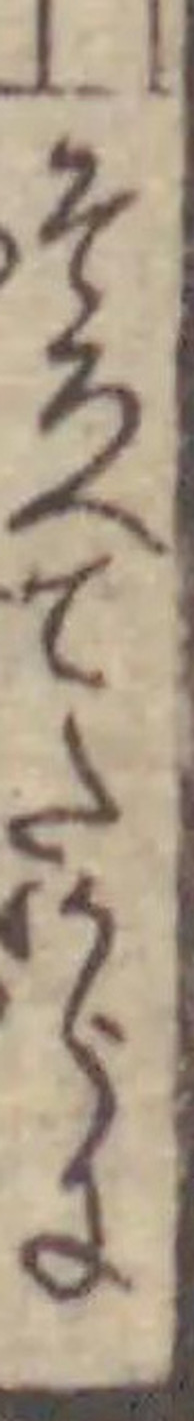そろへてたからに
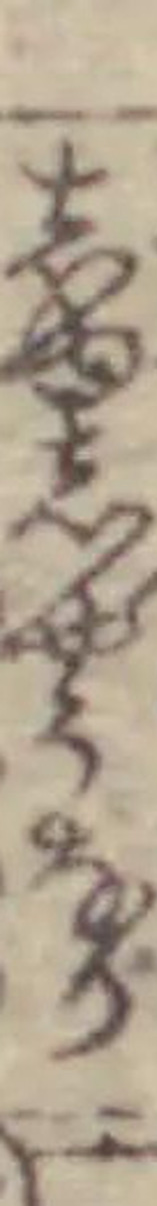しゆしやうなり
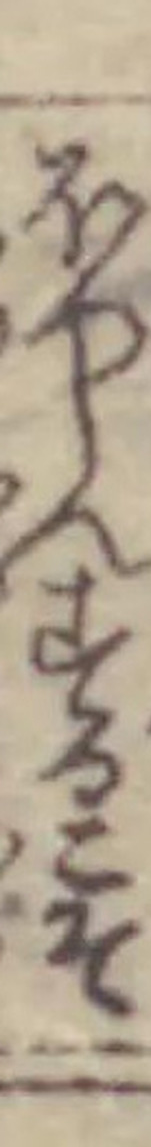ほつしんするこそ
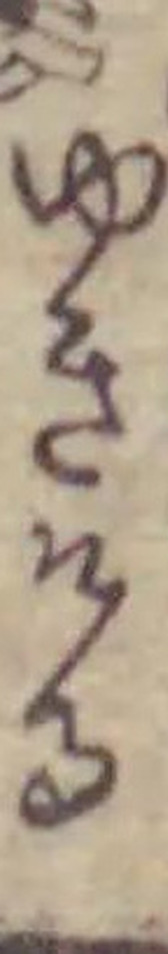ゆきける
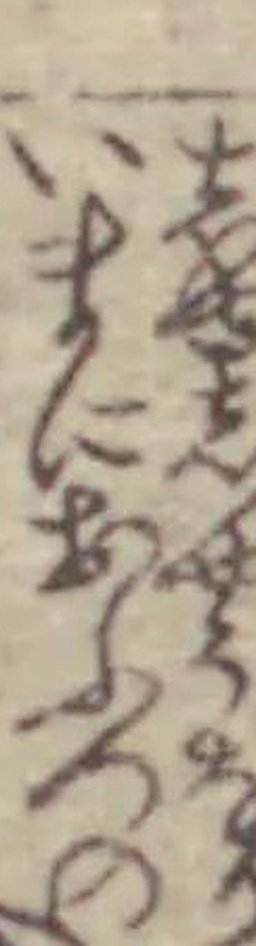いまにおふつの
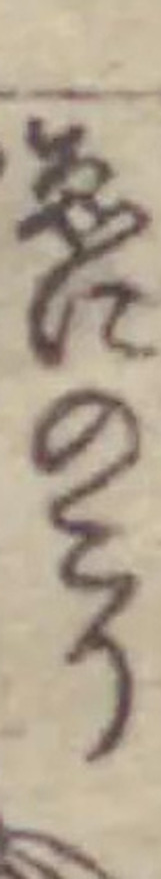ゑにのこり
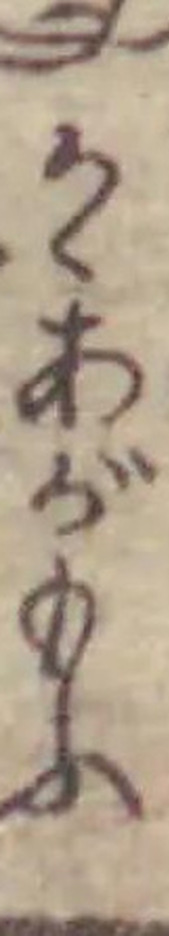かゝあがもふ
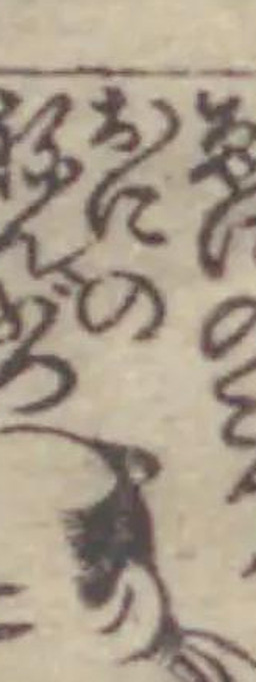ねんぶつ
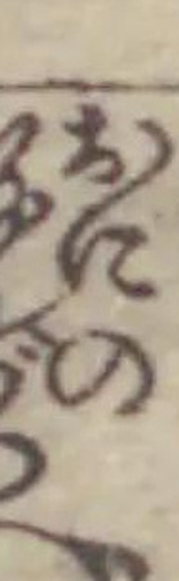おにの
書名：桃太郎元服姿 2巻
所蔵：国立国会図書館 National Diet Library, JAPAN
